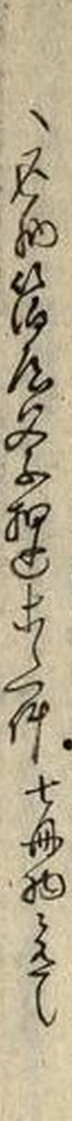へ返納箔屋父子御押込等之一件七冊物ニ有之
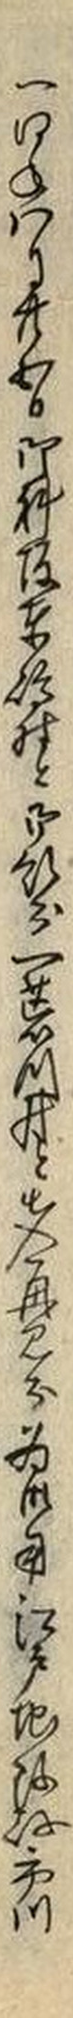一同年八月廿五日御料坂東嶋村と御領分一荒川村と出入再見分為御用江戸地改役市川
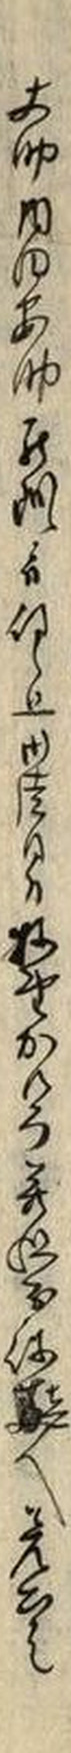丈助内田安助罷越候ニ付伺之上御徒目付牧野加左衛門幷組分役壱人差出之
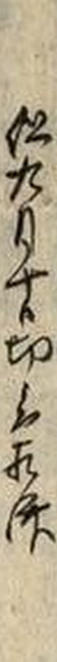但九月十日切ニ而相済
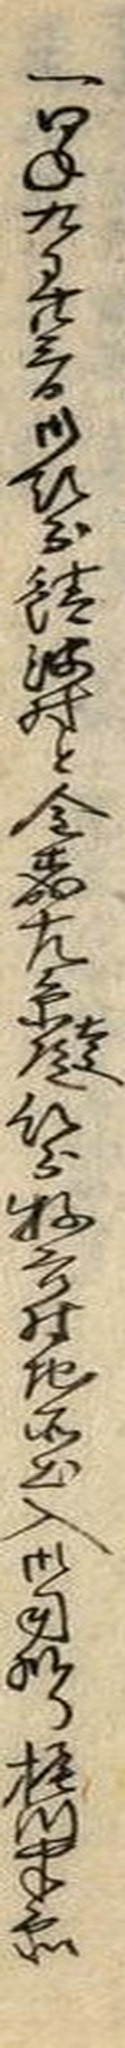一同年九月廿三日御領分鯖波村と金森左京太夫殿領分牧谷村地所出入御用掛り梶川半兵衛
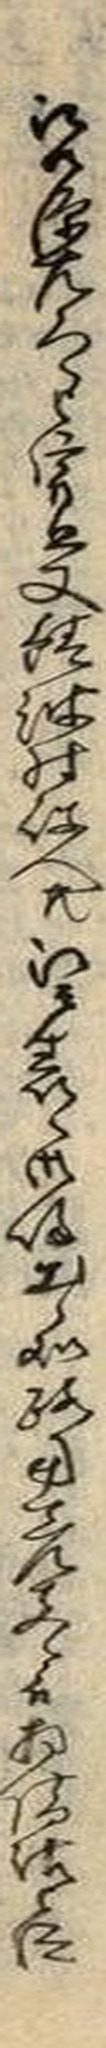江口源左衛門へ被仰付且又鯖波村役人共江戸表へ御呼出候処路用差支候ニ付拝借銀被仰
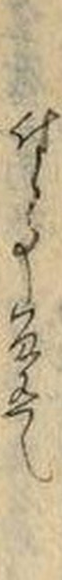付候事留有之
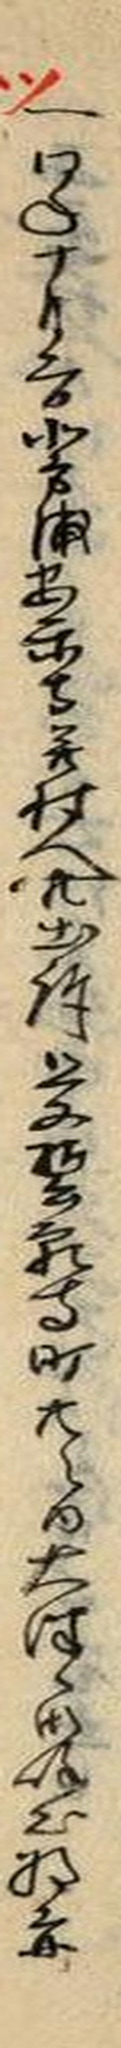一同年十月二日北方浦安楽寺村人共出訴且又誓願寺町共之内大津へ御呼出将亦

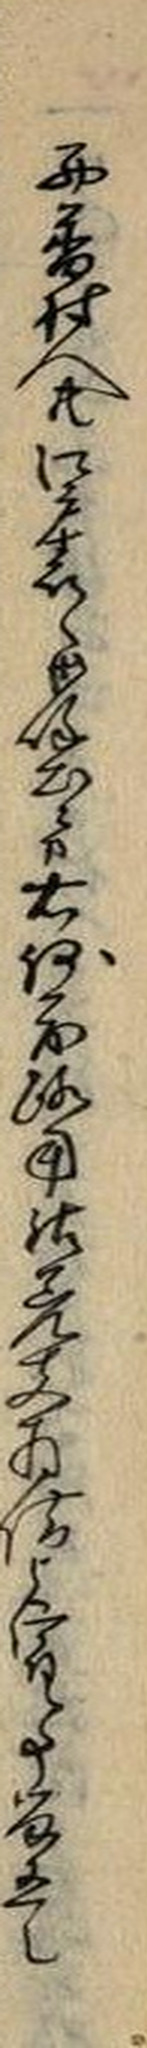西番村人共江戸表へ御呼出ニ付右何茂路用銀差支拝借被仰付候事留有之
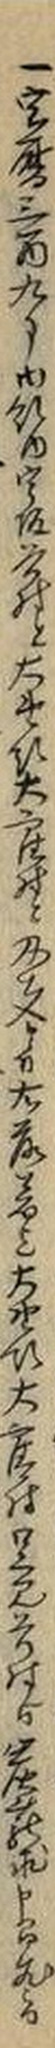一宝暦三酉九月御領内宇坂谷村と大野領大雇村と及出入候ニ付右落着迄大野領大雇村足見谷村ゟ炭薪求申間敷旨
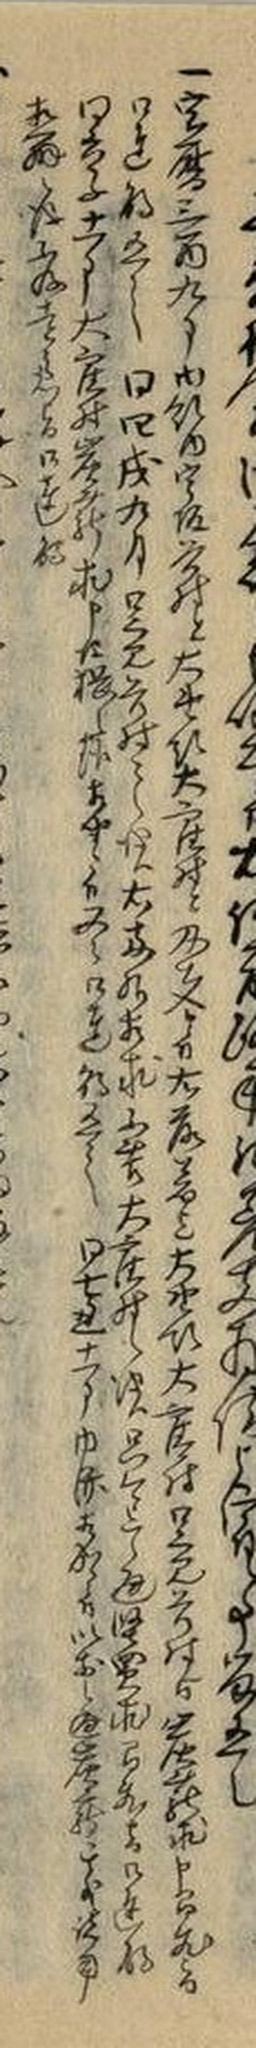口達触有之同四戌九月足見谷村之儀ハ右両様相求不苦大雇村之儀ハ只今迄之通堅買求間敷旨口達触
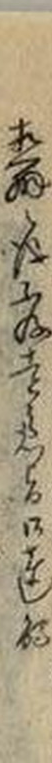相弁候儀不及遠慮旨口達触
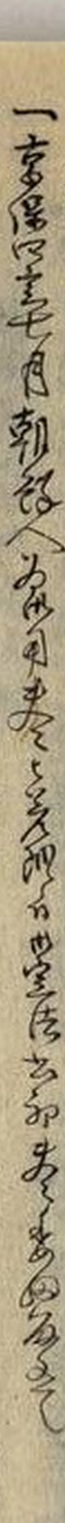一享保四亥七月朝鮮人為御用夫々被差越候ニ付御定法書初夫々委細留有之
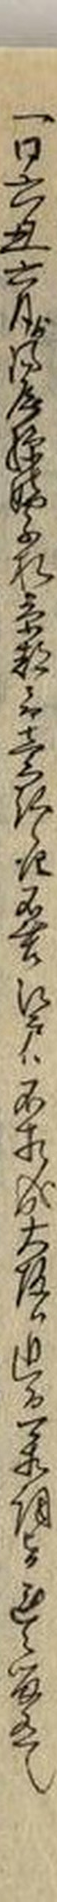一同六丑六月ゟ湯尾孫嫡子札京都ニ而売弘候儀不苦江戸ハ不相成大坂ハ追而可相調旨連々留有之
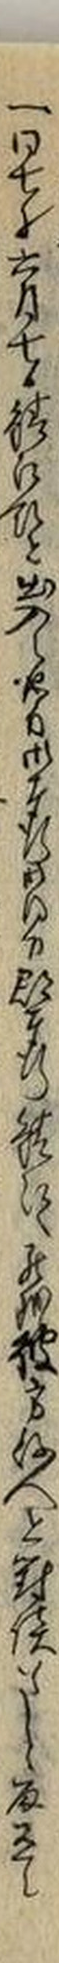一同七寅六月七日鯖江領と出入之儀ニ付御奉行御目付郡奉行鯖江へ罷越彼方役人と対談いたし候留有之
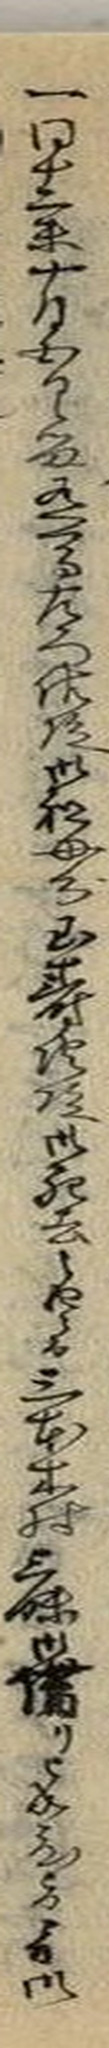一同十二未十月五日之留有馬左衛門佐殿御祖母分玉寿院殿御死去之由ニ而三本木村三昧御借り被成度旨ニ付御
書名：御国他国諸事之部
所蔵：福井県文書館 Fukui Prefectural Archives
